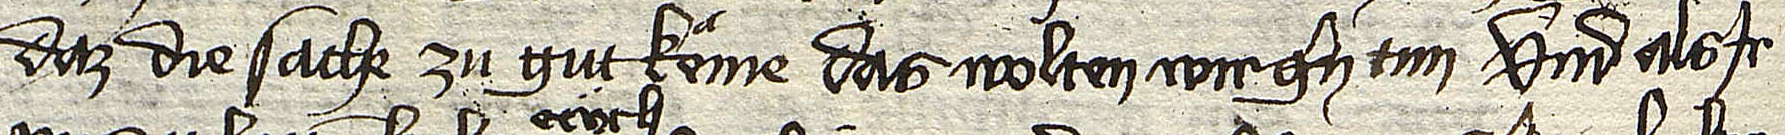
daʒ die ſache ʒu gut këme das wolten wir gn* tun / Vnd als Ir
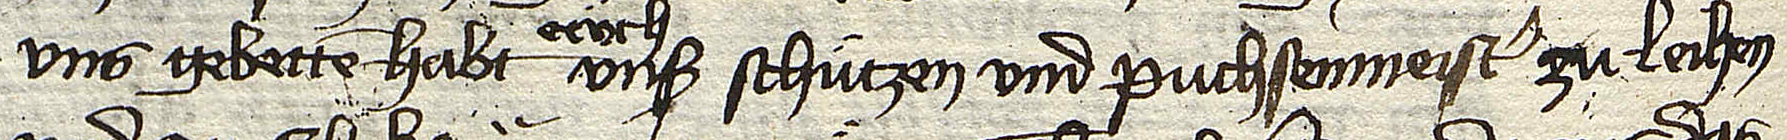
vns gebette* habt vnſ* ſchücʒen vnd Puchſenmeiſt* ʒu leihen
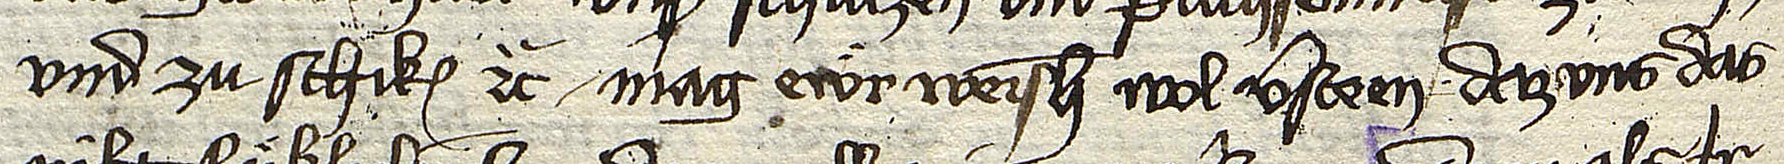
vnd ʒu ſchik* ec* / mag ewr weiſh* wol v*ſteen . daʒ vns das
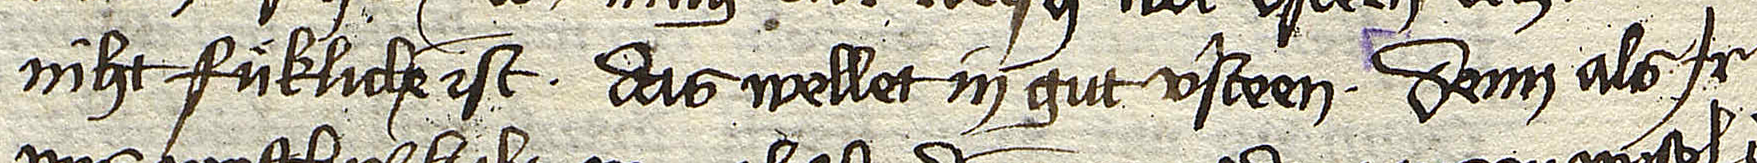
niht fükliche* iſt . das wellet in gut v*ſteen . Denn als Ir
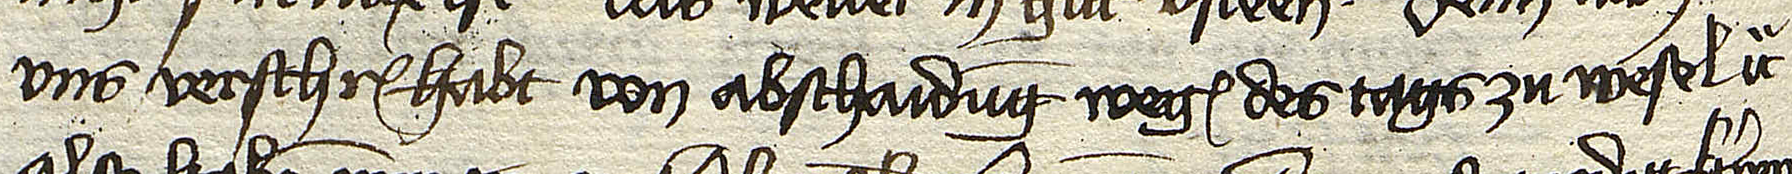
vns verſchr* habt von abſchaidu*g weg* des tags ʒu weſel ec*
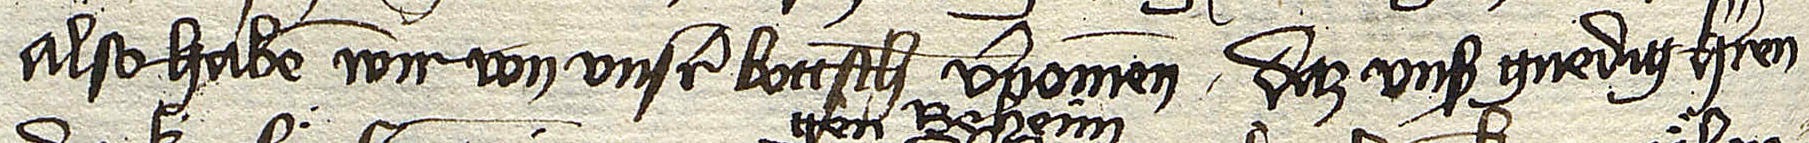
Alſo habe* wir von vnſ*r bottſch* v*nomen* / daʒ vnſ* gnedig* h*ren
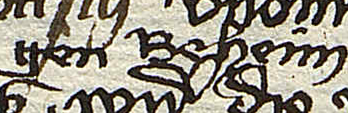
gen Beheim
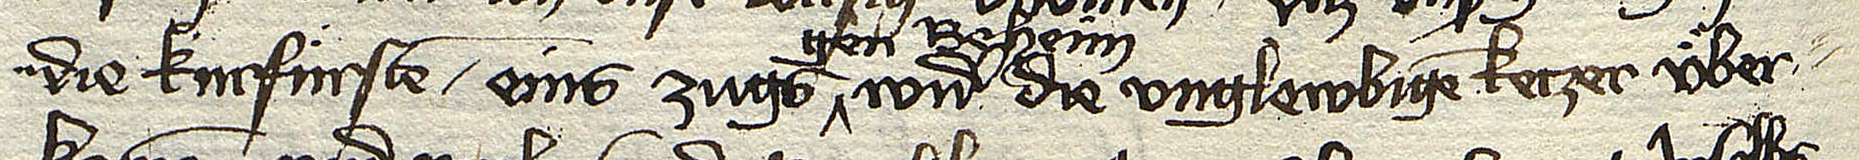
~ die kurfürſte* / eins ʒugs wid* die vnglewbige* kecʒer v̈ber =
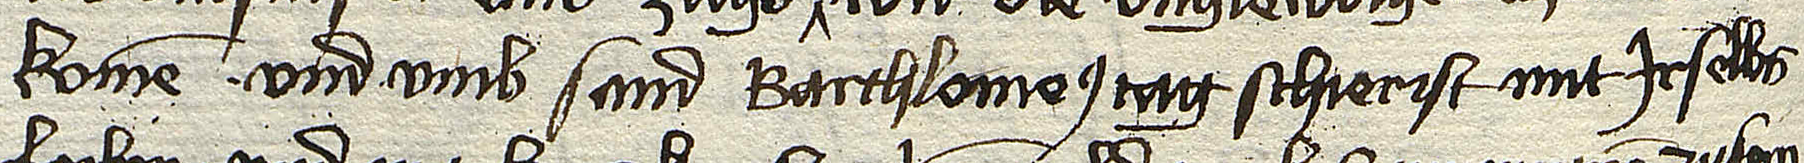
kome* . vnd vmb ſand Barthlomei tag ſchieriſt mit Irſelbs
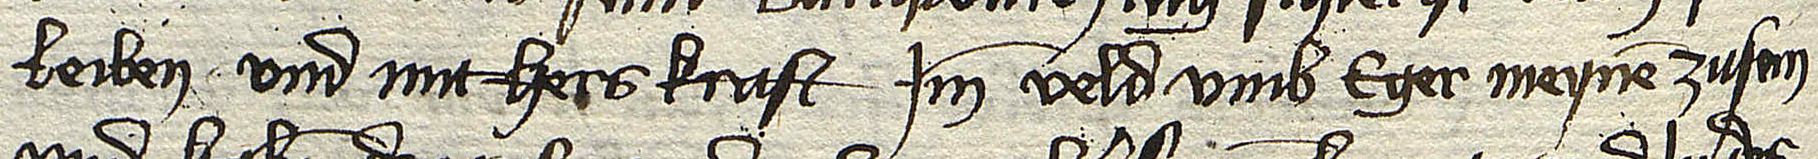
leiben vnd mit hers kraft Im veld vmb Eger meyne* ʒuſein
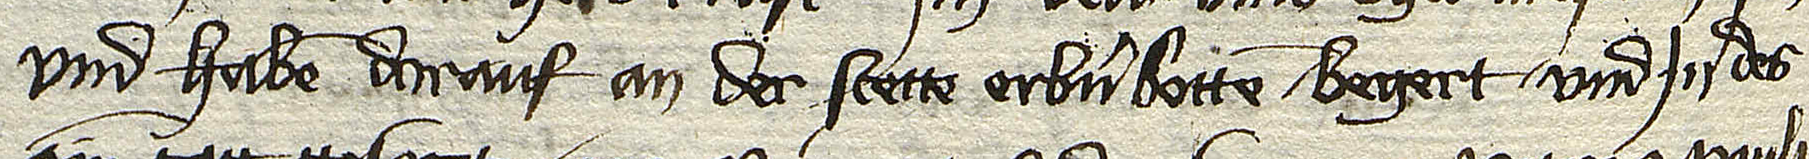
vnd habe* darauf an der ſtette erbn* botte* / begert / vnd In des
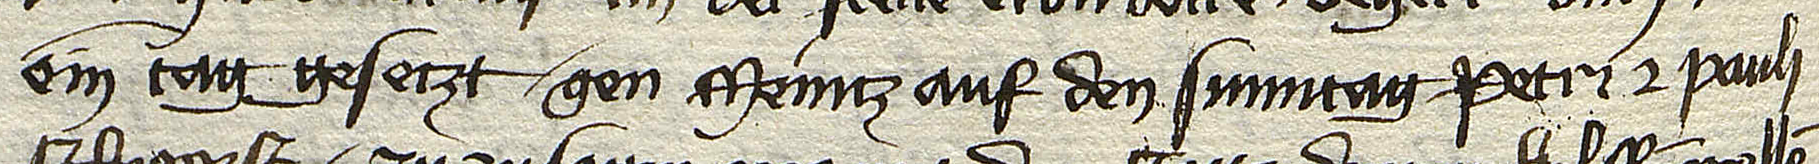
ein* tag geſecʒt / gen Meincʒ auf den ſunntag Petri @ pauli
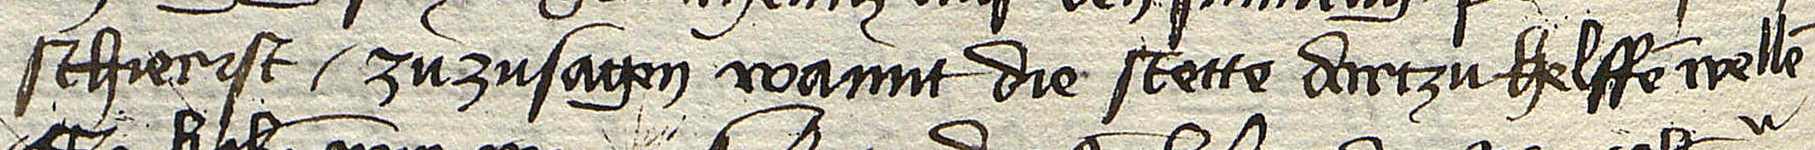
ſchieriſt / ʒu ʒuſagen wamit die ſtette darcʒu helffe* welle*
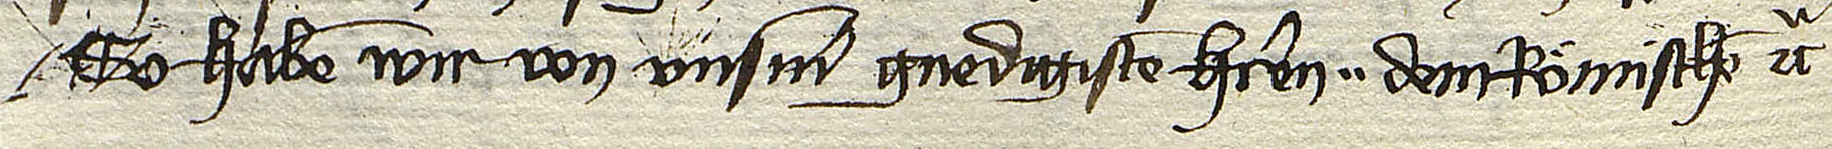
So habe* wir von vnſ*m gnedigiſte* h*ren ~ dem Römiſche* ec*
